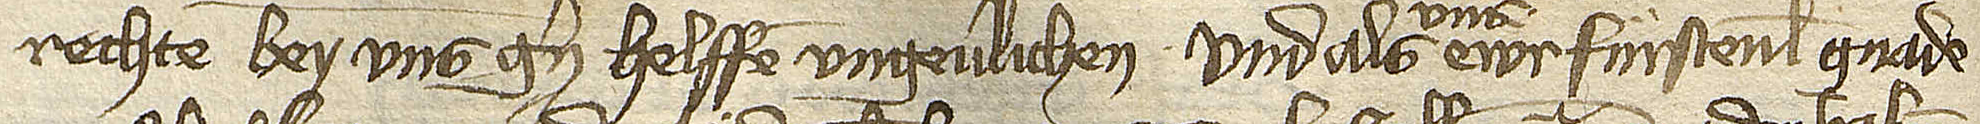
rechte* bey vns g*n helffe* vngeu*lichen vnd als ewr fürſtenl* gnade
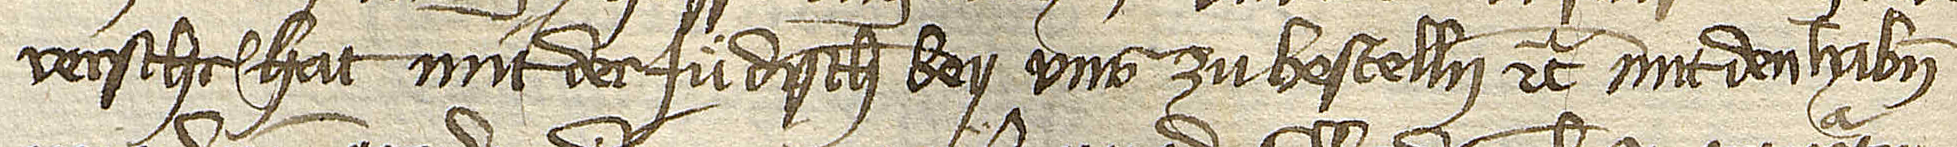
verſchr* hat mit der Iüdiſch* bey vns ʒu beſtelln* ec* mit den habn*
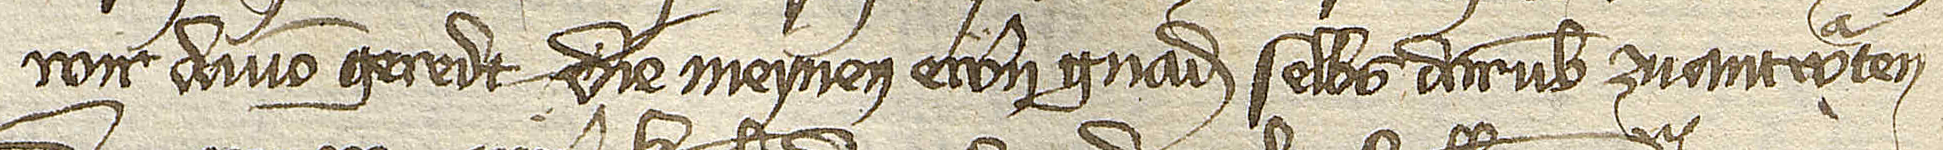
wir dauo* geredt Die meynen ew*n gnad* ſelbs darub* ʒuantw*ten
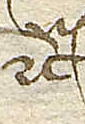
ec*
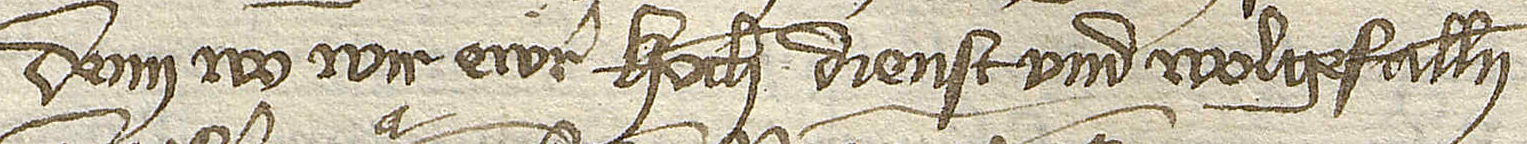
Denn wo wir ewr* Hoch* dienſt vnd wolgefalln*
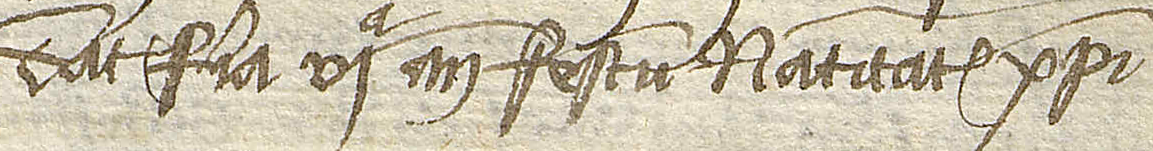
Dat* fi*a vi* an* feſtu* Natitat* xpi*
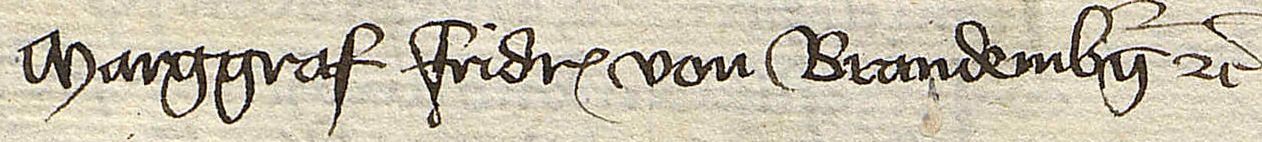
Marggraf Fridr* von Brandemb*g ec*
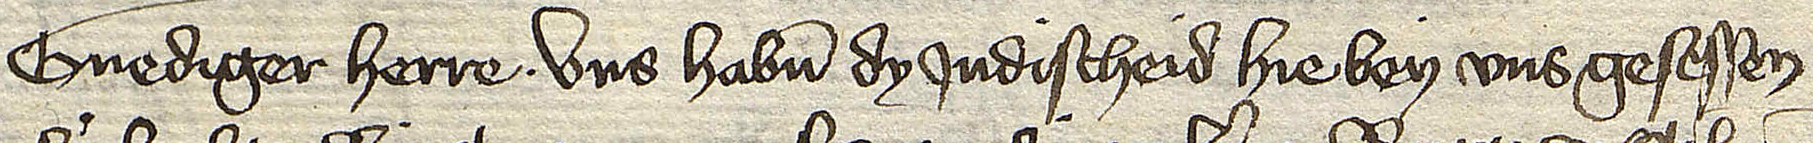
Gnediger herre . Vns habn* dy Iudiſcheid hie bey vns geſeſſen
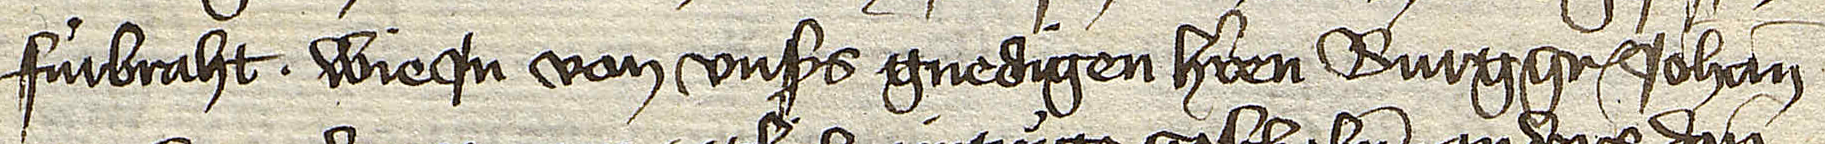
fürbraht . wie In von vnſ*s gnedigen hr*en Burggr* Iohan*
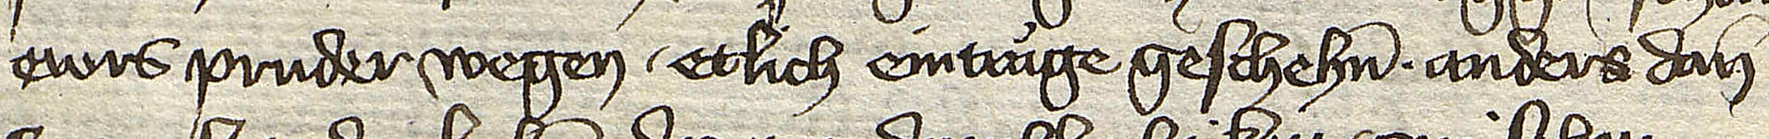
ewrs pruder wegen / etlich einträge geſchehn* . anders dan*
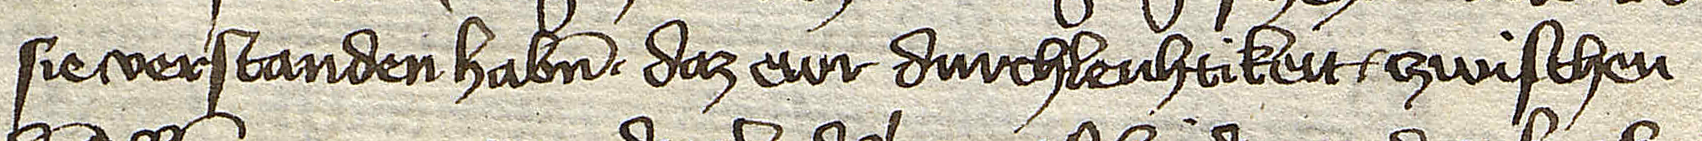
ſie verſtanden habn* / daʒ ewr durchleuhtikeit / cʒwiſchen
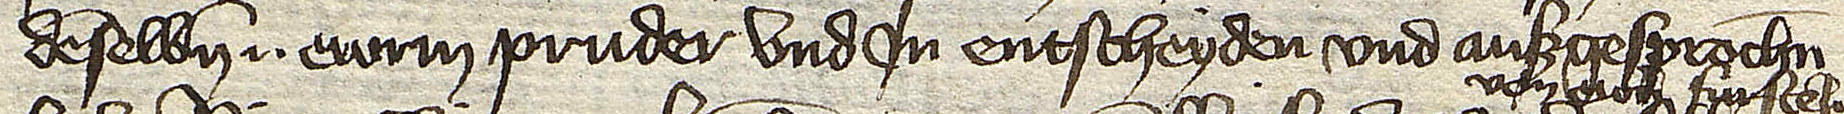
de*ſelbn* ~ ewrm pruder vnd In entſcheyden vnd auſʒgeſprochn*
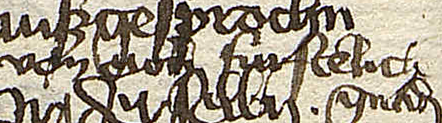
von ewn* furſte*lich*
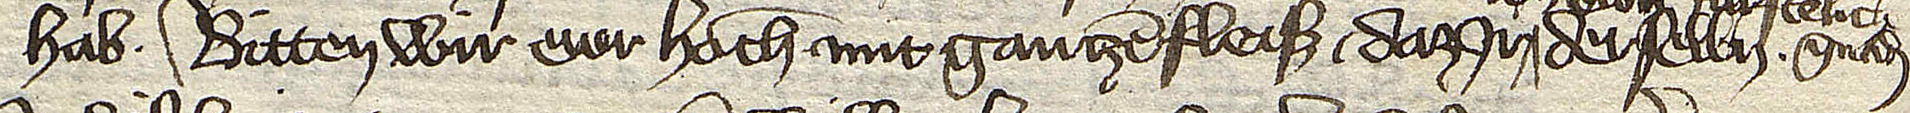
hab . Bitten wir ewr hoch* mit gancʒe* fleiſʒ / daʒ Ir derſelbn* gnad*
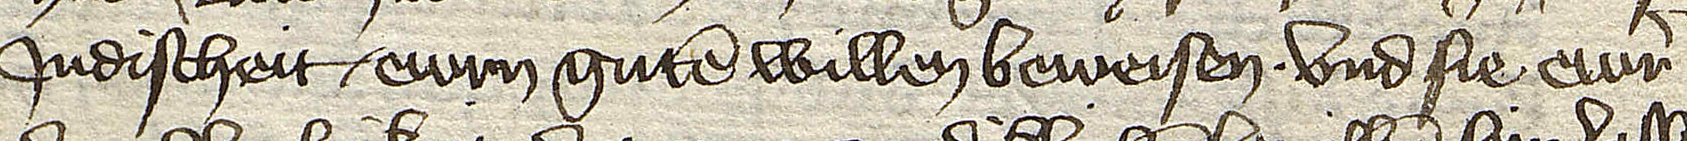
Iudiſcheit / ewrn gute* willen beweiſen . vnd ſie ewr*
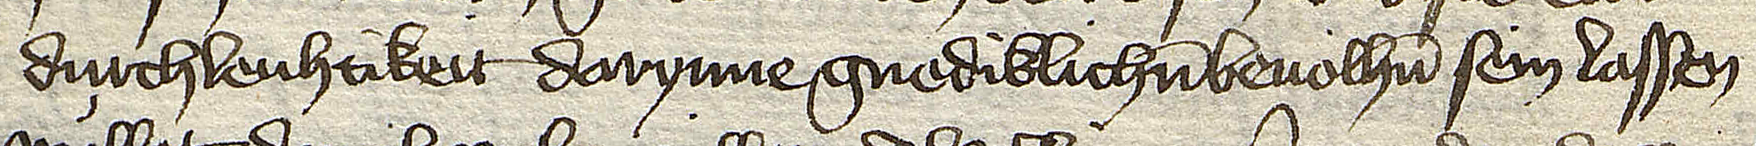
durchleuhtikeit darynne gnediklichn* beuolhn* ſein laſſen
